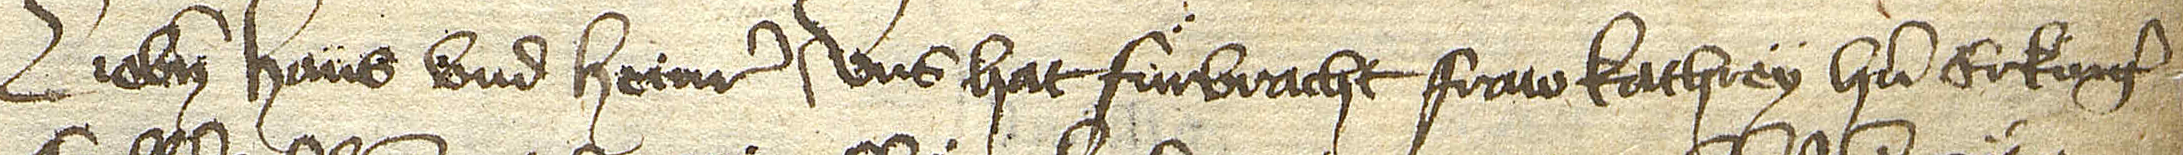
Liebn* hans vnd heinr* / Vns hat fürbracht frau Kathrey hn* Erking*
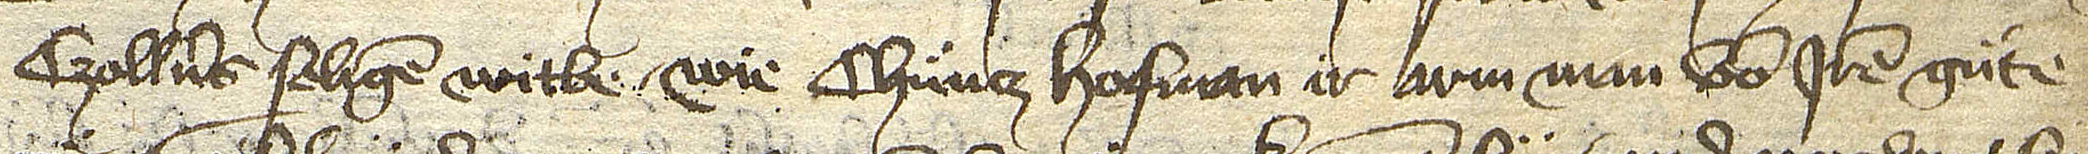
Cʒolln*s ſelige* witbe / wie Chüncʒ hofman ir arm man vo* Ire* güte
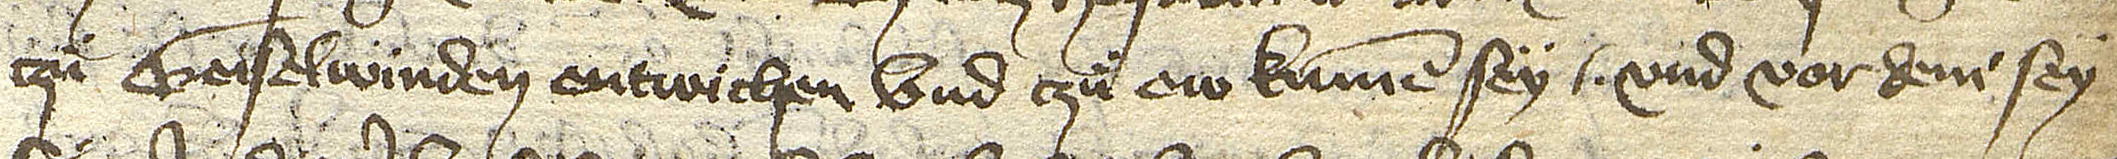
cʒü Geiſelwinden entwichen vnd cʒü ew kume* ſey / . vnd vor dem ſey
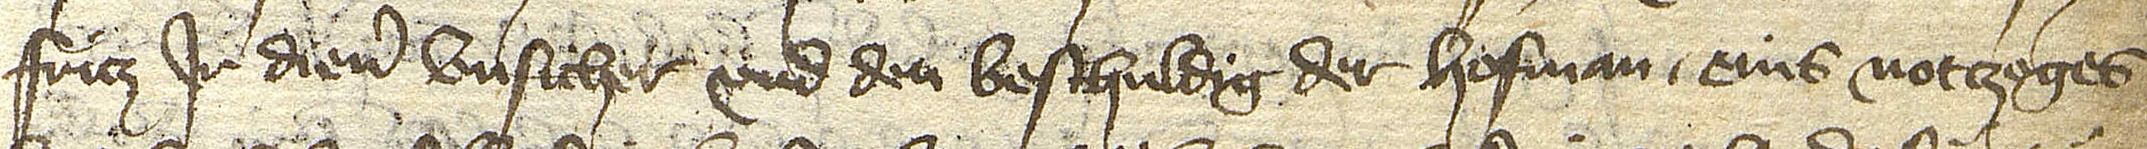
fricʒ Ir dien* vnſicher vnd den beſchuldig der hofman / eins notcʒoges
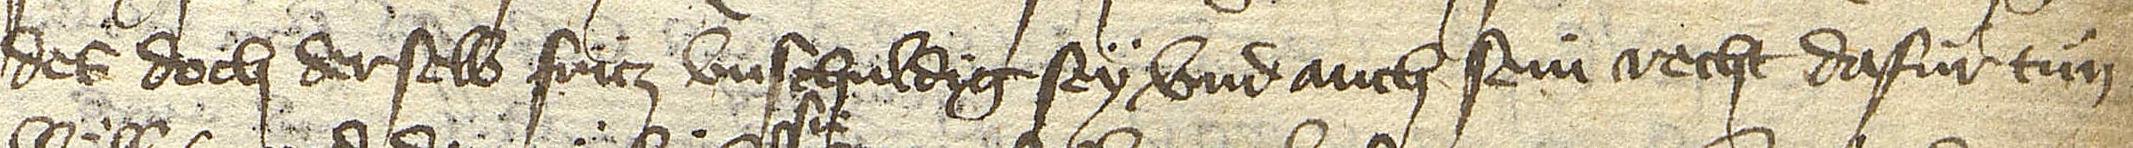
des doch derſelb fricʒ vnſchuldig ſey / vnd auch ſein recht dafür tün
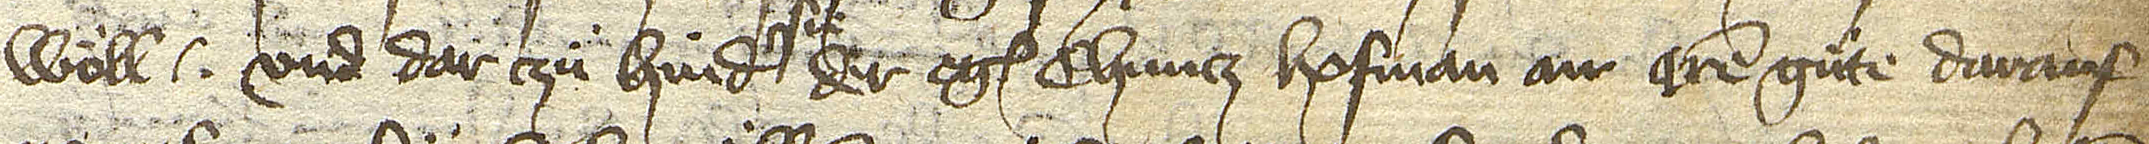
wöll / . vnd dar cʒü hind* der eg* Chuncʒ hofman an Ire* güte darauf
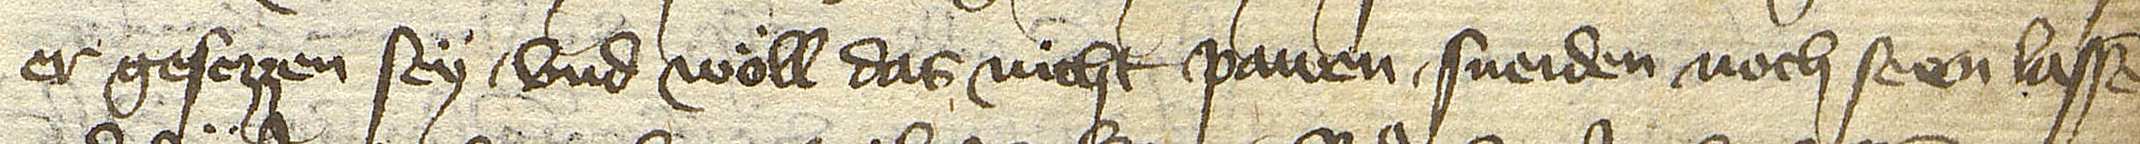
er geſeʒʒen ſey / vnd wöll das nicht pawen / ſneiden noch ſeen laſſe*
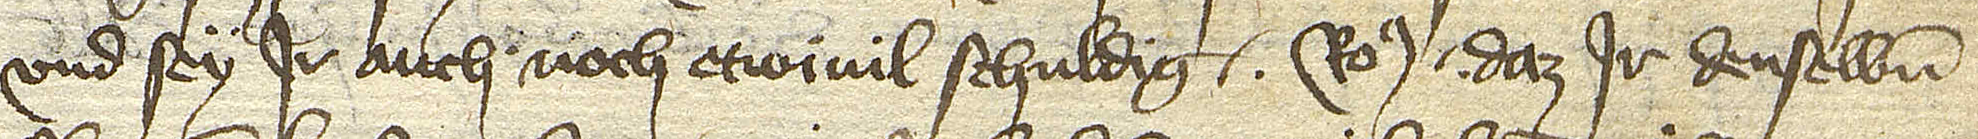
vnd ſey Ir auch noch etwiuil ſchuldig / . Ro* / . daʒ Ir denſelbn*
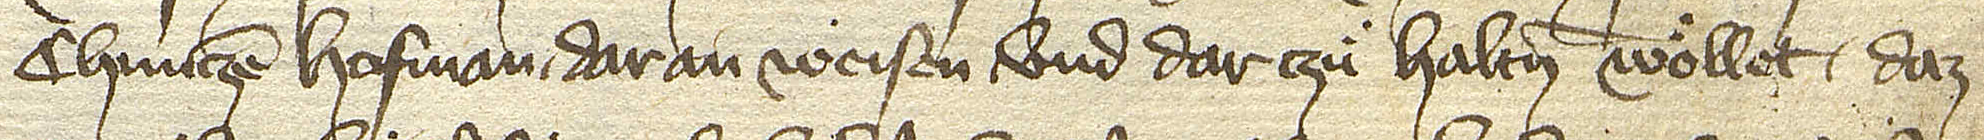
Chuncʒe* hofman / daran weiſen / vnd darcʒü haltn* wöllet / daʒ
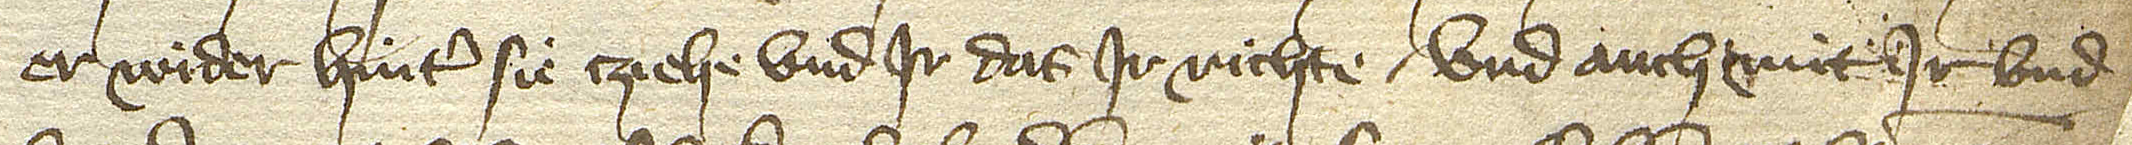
er wider hint* ſie cʒiehe vnd Ir das Ir richte / vnd auch mit Ir vnd
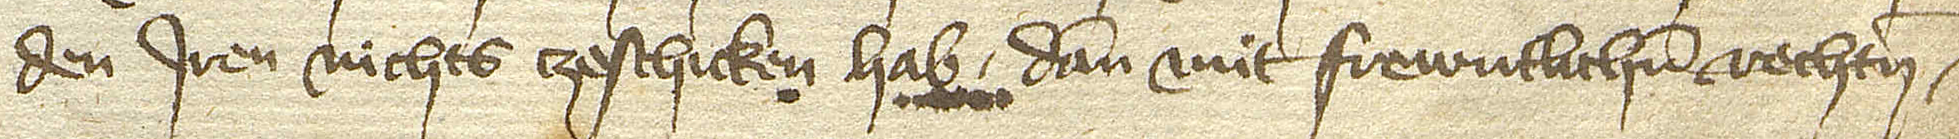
den Iren nichts cʒeſchicken hab / dan* mit frewntlichn* rechtn* /
